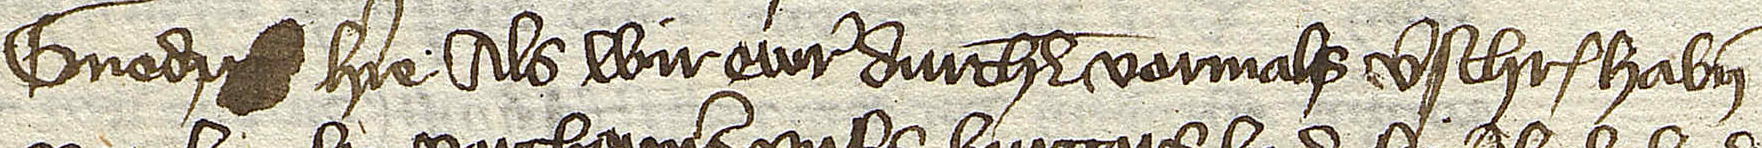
Gnedig* h*re . Als wir ew*r durchl* vormals v*ſchr* hab*n
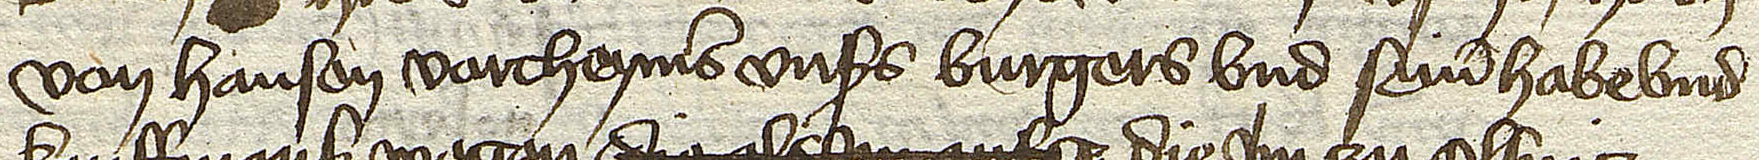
von hanſen vorcheym*s vnſ*s burgers vnd ſein* habe vnd
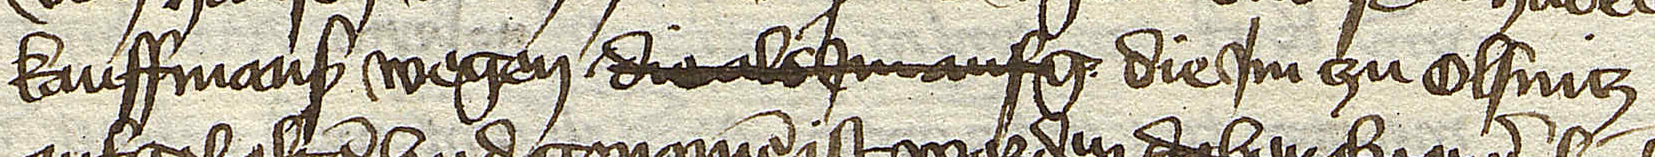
kauffmanſ* wegen / die als Im aufg die Im cʒu Olſnicʒ
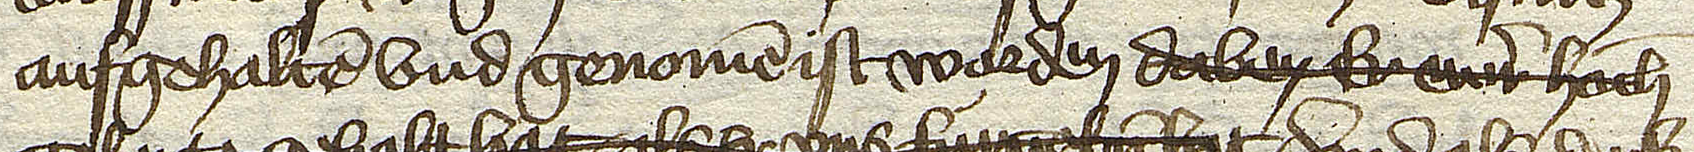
aufgehalte* vnd genome* iſt worden dabey Er ew*r hoch*
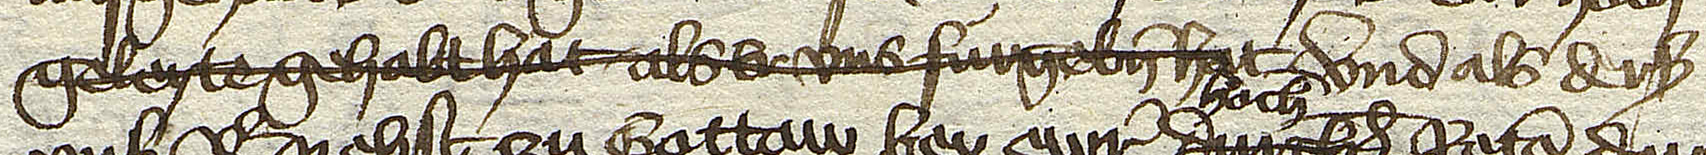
geleyte gehalt hat / als Er vns fürgebn* hat / Vnd als derſ*
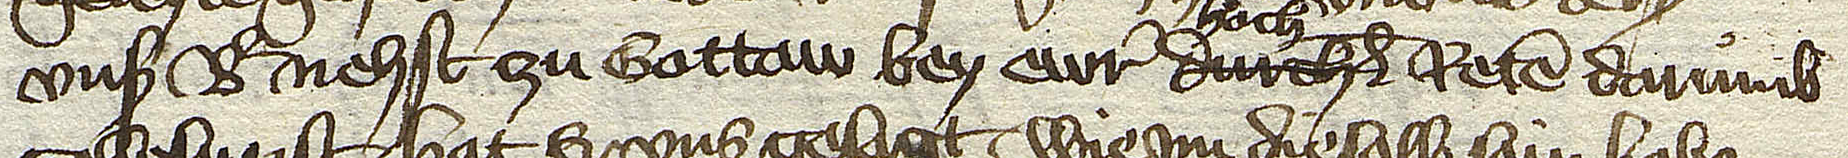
vnſ* B* nehſt cʒu Gattaw bey ew*r durchl* Rete* darümb
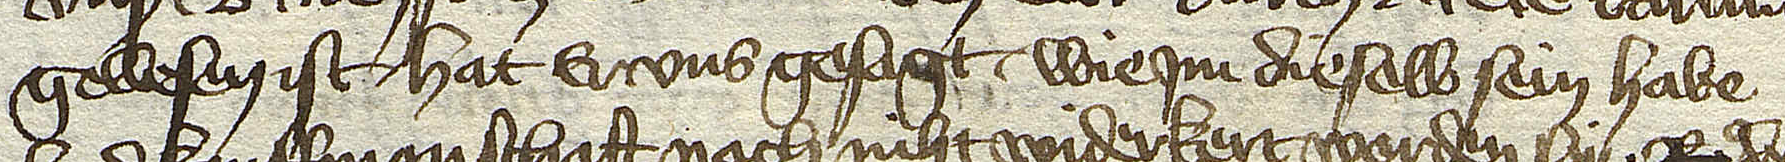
geweſen iſt hat Er vns geſagt / wie Im dieſelb ſein habe
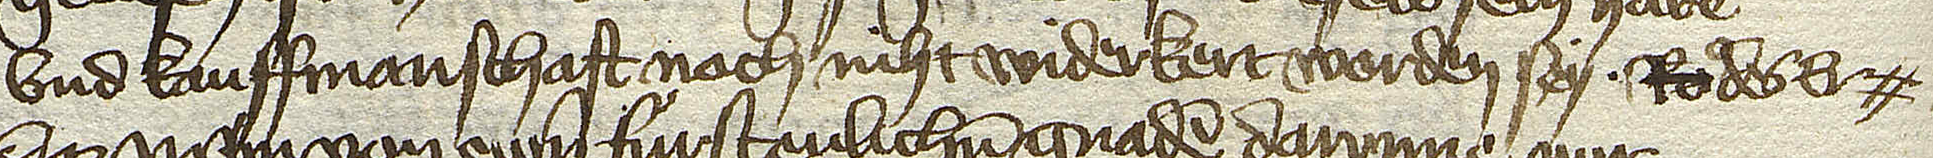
vnd kauffmanſchaft noch niht widerkert worden ſey . Ro* des Er
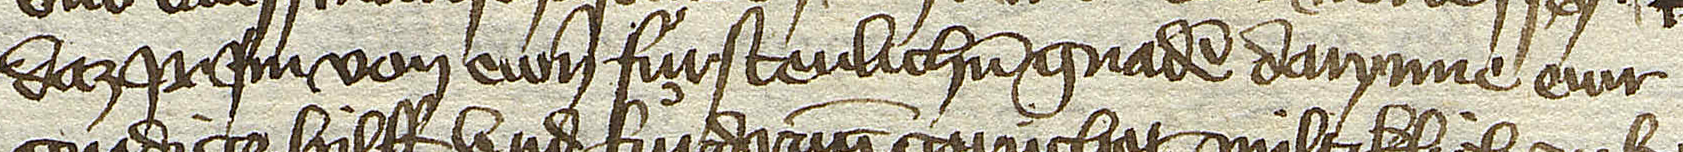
daʒ Ir Im von ew*n fürſtenlich*n gnade* darynne ewr
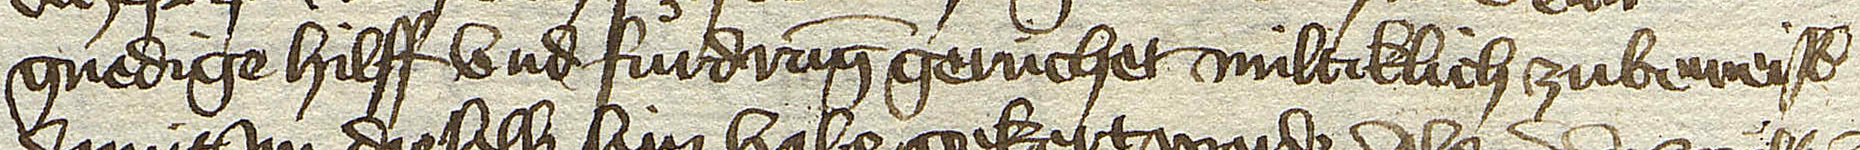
gnedige hilff vnd fürdru*g gerüchet miltiklich cʒubeweiſ*
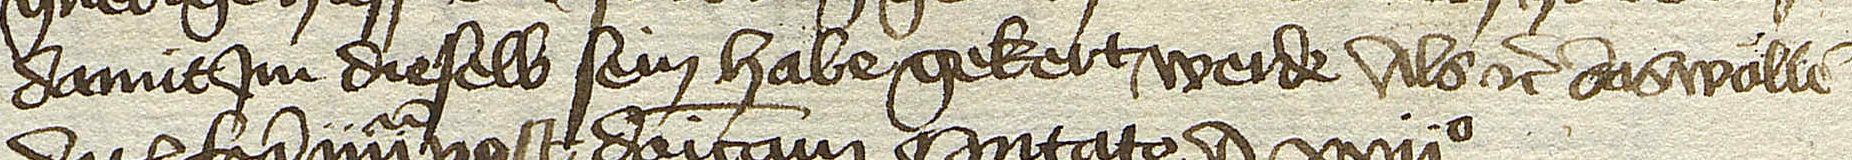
damit Im dieſelb ſein habe gekert werde Als ec* das wölle*
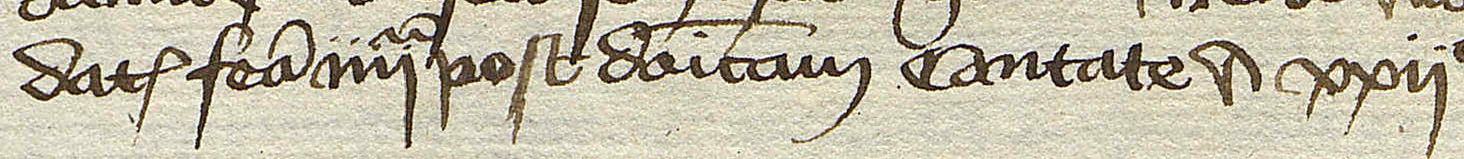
dat* fea* iiii* poſt doicam* Cantate A xxii*
